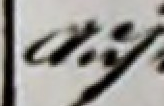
Aus„
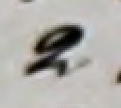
2
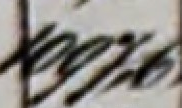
1097,6
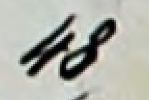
48
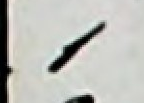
1
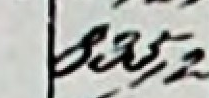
835,2
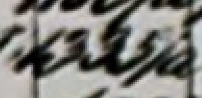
1335/a
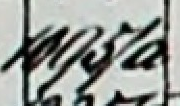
1095/a
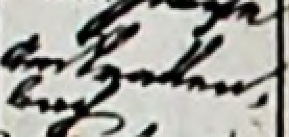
Anlegatten„
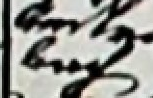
buch
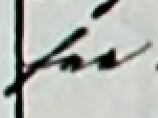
see
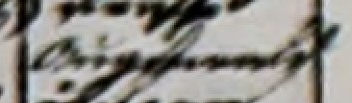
Augstwald
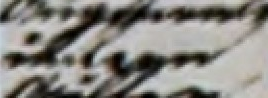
???
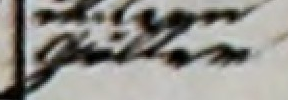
Gütter
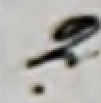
2
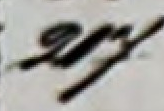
217
